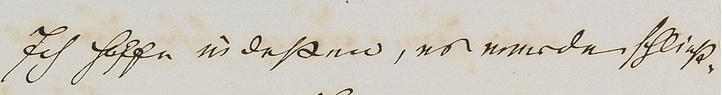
Ich hoffe indeßen, es werde schließ-
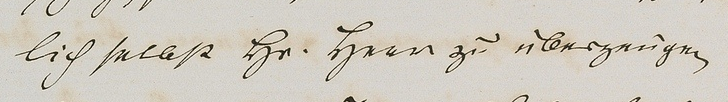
lich selbst Hr. Heer zu überzeugen
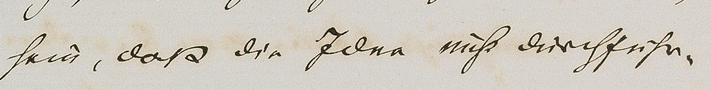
sein, daß die Idee nicht durchführ-
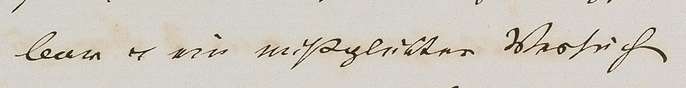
bar & ein mißglükter Versuch
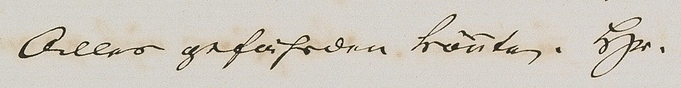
Alles gefährden könnte. Hr.
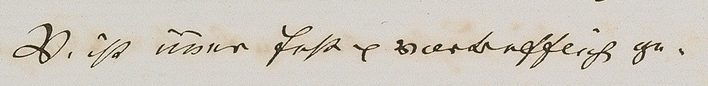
W. ist immer fest & vortrefflich ge-
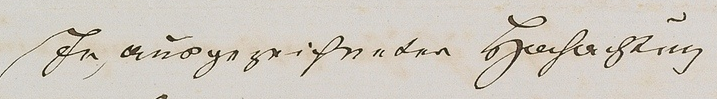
In ausgezeichneter Hochachtung
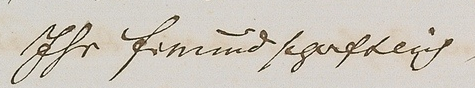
Ihr freundschaftlich
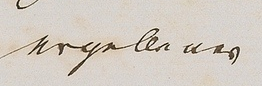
ergebener
